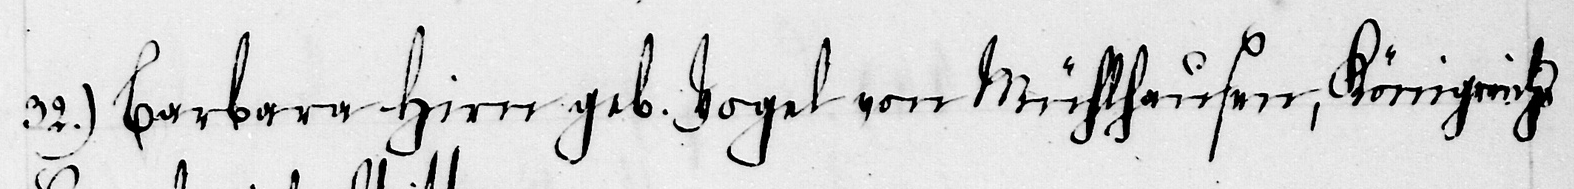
32.) Barbara Hirn geb. Vogel von Mühlhausen, Königreichs
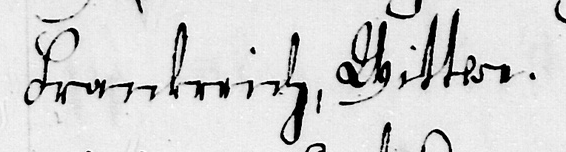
Frankreich, Wittwe.
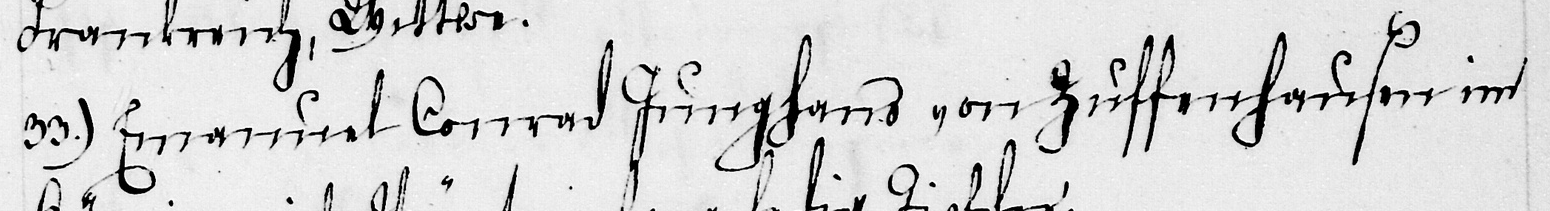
33.) Emanuel Conrad Junghans von Zuffenhausen im
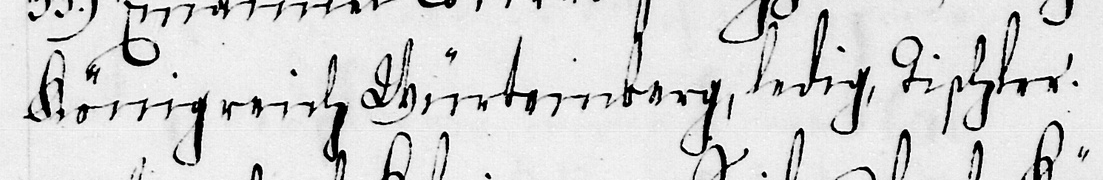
Königreich Würtemberg, ledig, Tischler.
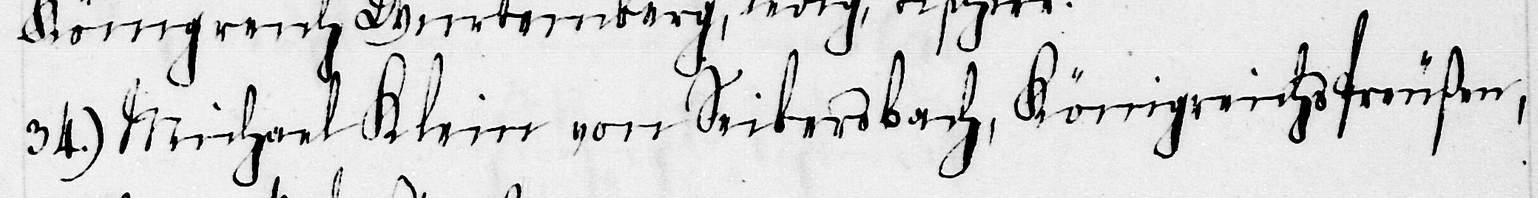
34.) Michael Klein von Seibersbach, Königreichs Preußen,
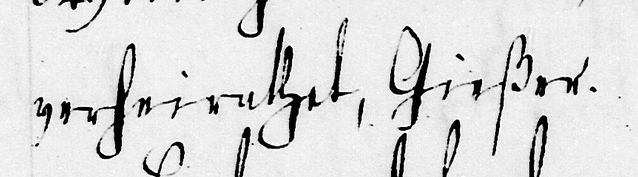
verheirathet, Gießer.
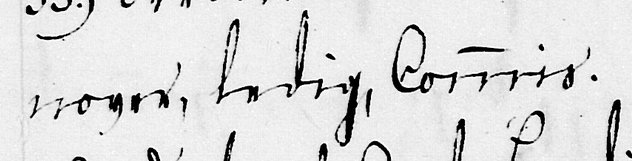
nover, ledig, Commis.
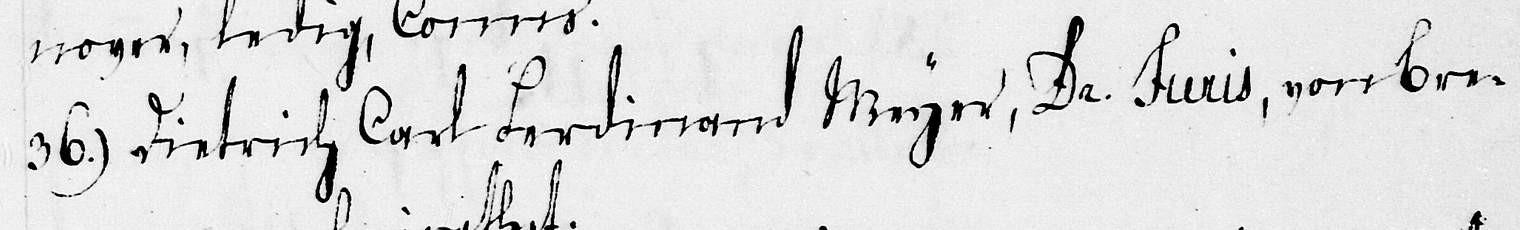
36.) Dietrich Carl Ferdinand Meyer, Dr. Juris, von Bre¬
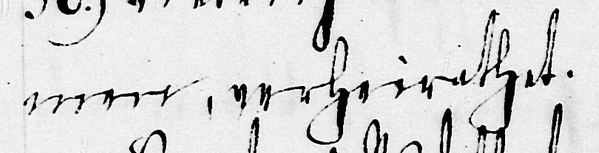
men, verheirathet.
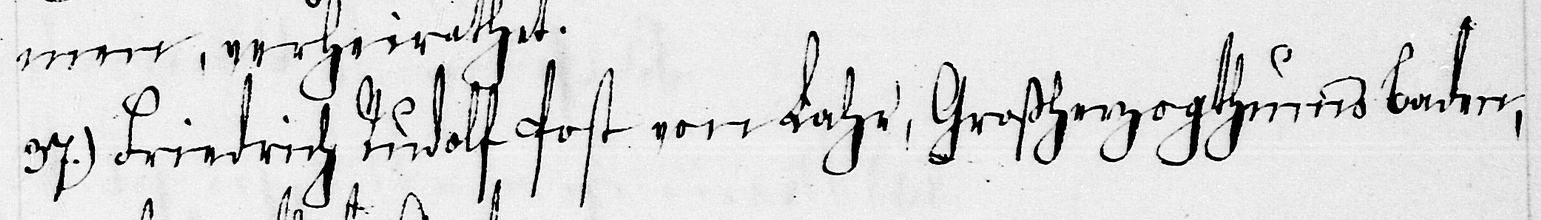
37.) Friedrich Rudolf Post von Lahr, Großherzogthums Baden,
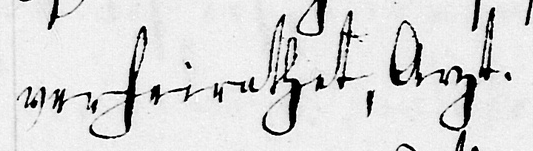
verheirathet, Arzt.
